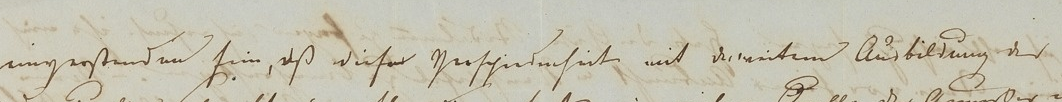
einverstanden sein, daß dieser Verschiedenheit mit der weitern Ausbildung des
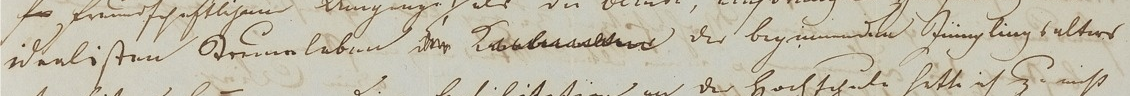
idealisten Traumleben des Knabenalters des beginnenden Jünglingsalters
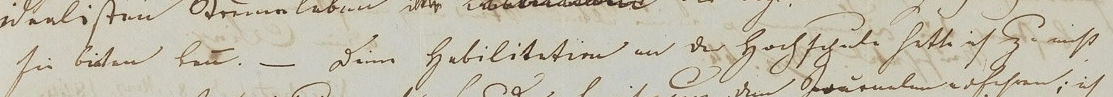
sie bieten kann. ­ Deine Habilitation an der Hochschule hatte ich zu nicht
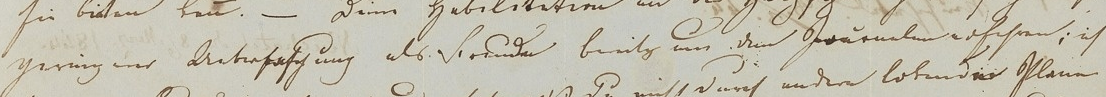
geringerer Ueberraschung als Freude bereits aus den Journalen erfahren; ich
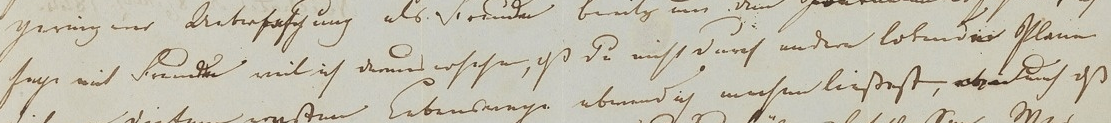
sage mit Freude weil ich daraus ersehe, daß du nicht durch andere lokendre Plane
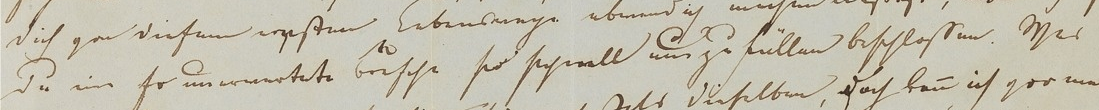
du eine so unerwartete Bresche so schnell aus zu füllen beschloßen. Was
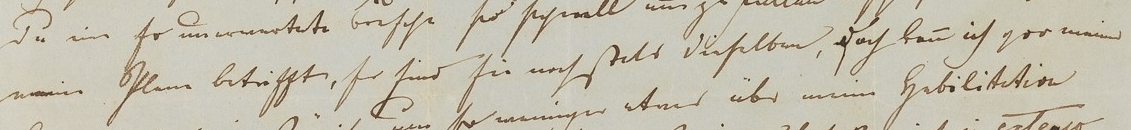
meine Plane betrifft, so sind sie noch stets dieselben, doch kann ich vor meiner
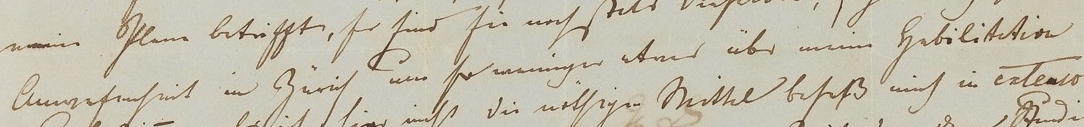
Anwesenheit in Zürich um so weniger etwas über meine Habilitation
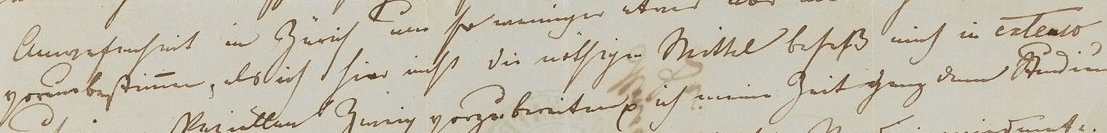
vorausbestimmen, als ich hier nicht die nöthigen Mittel besaß mich in extenso
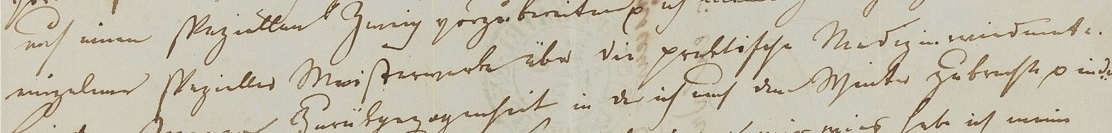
einzelner spezieller Meisterwerke über die praktische Medizin wiedmete.
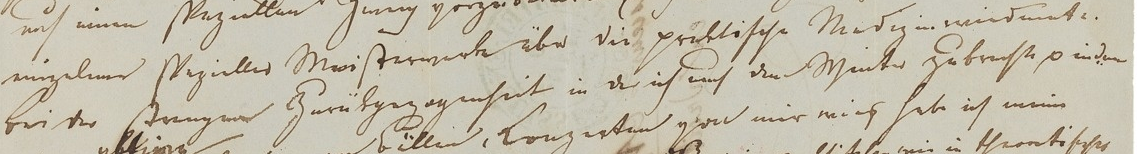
Bei der strengen Zurückgezogenheit in der ich auch den Winter zubrachte & in dem
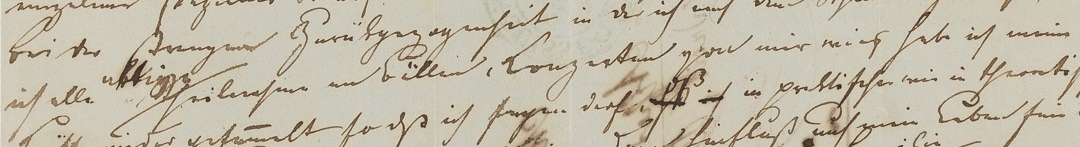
ich alle aktive Theilnahme an Bällen, Conzerten von mir wies, habe ich meine
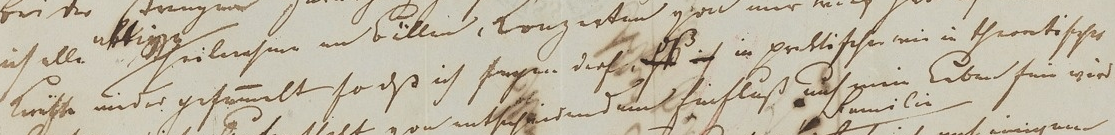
Kräfte wieder gesammelt so dß ich sagen darf, dssdß in praktischer wie in theoretischer
